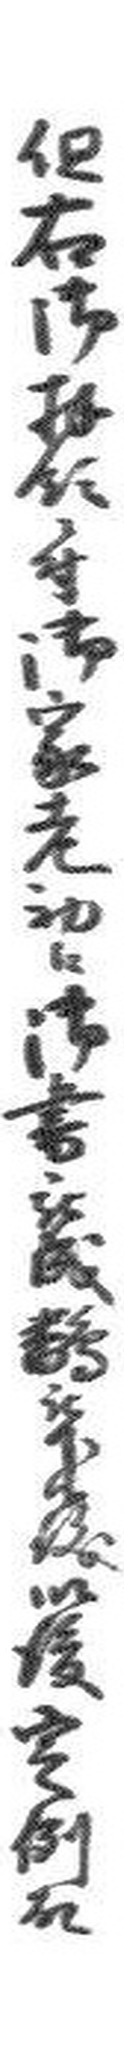但右御拝領ニ付御家老初江御書被成鷭被下候儀以後定例

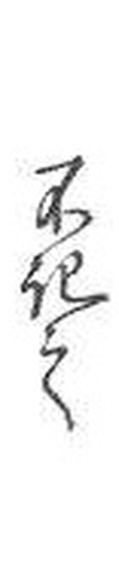不記之
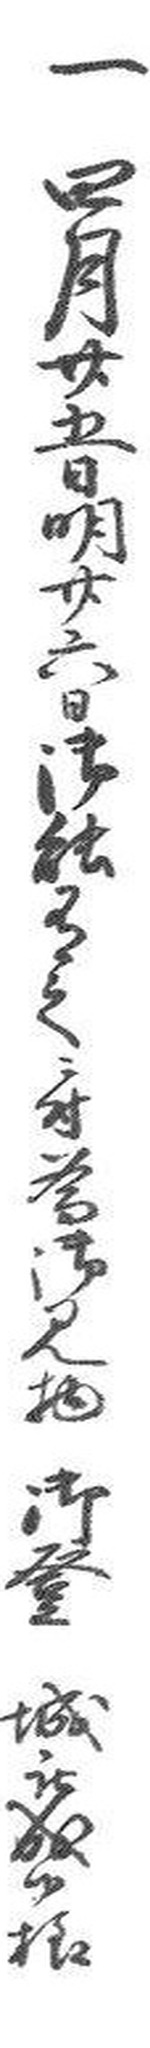一四月二十五日明廿六日御能有之ニ付為御見物御登城被成候様
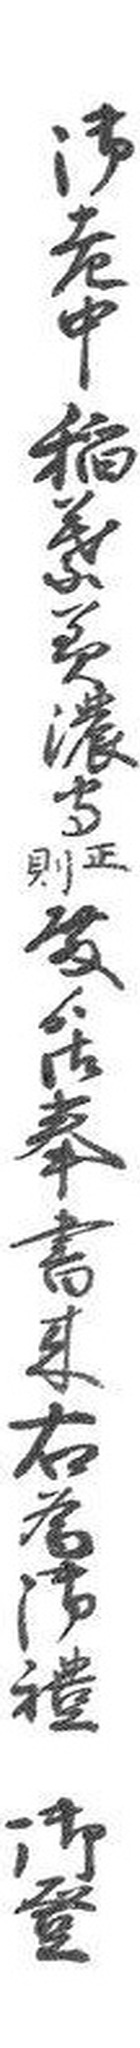御老中稲葉美濃守正則殿ゟ御奉書来右御礼
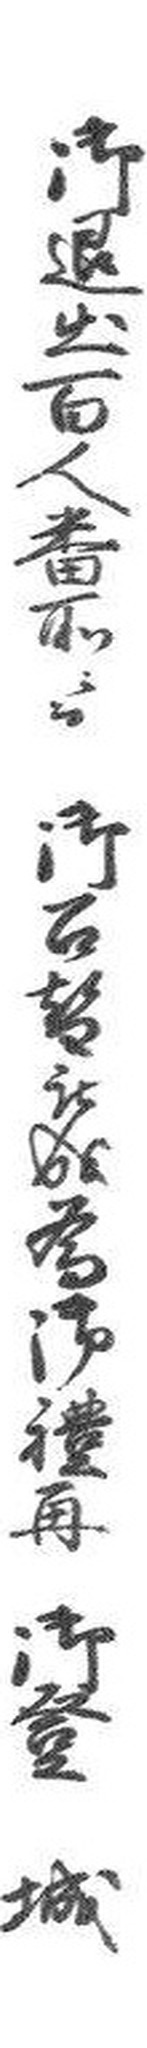御退出百人番所ニ而御召替被成御礼再御登城
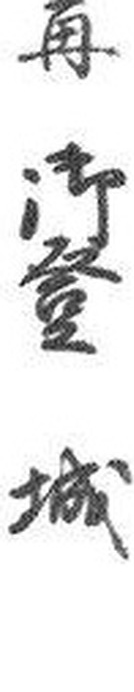御登城
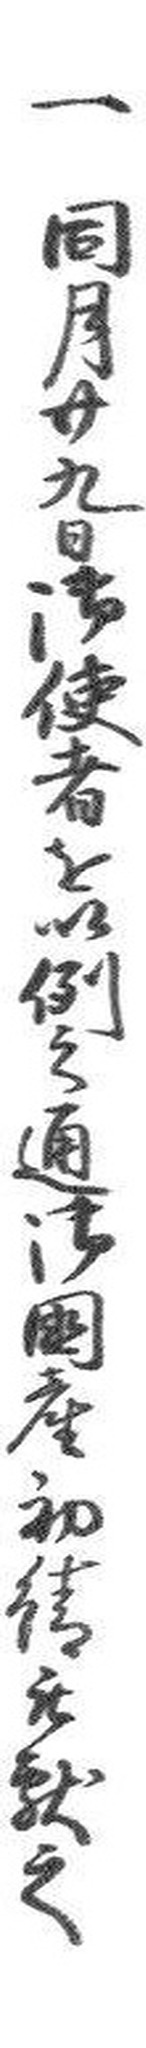一同月廿九日御使者を以例之通御国産初鯖被献之
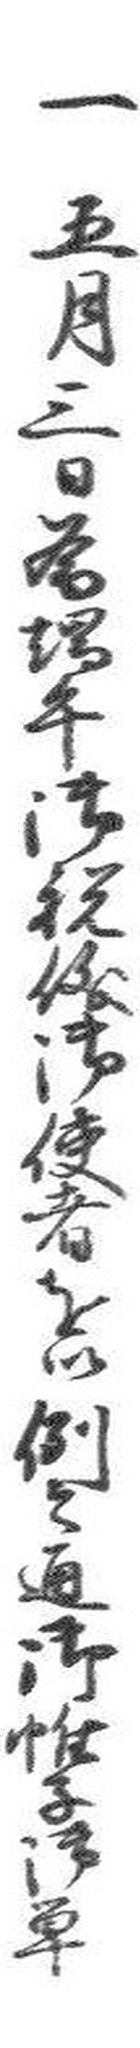一五月三日為端午御祝儀御使者を以例之通御帷子御単
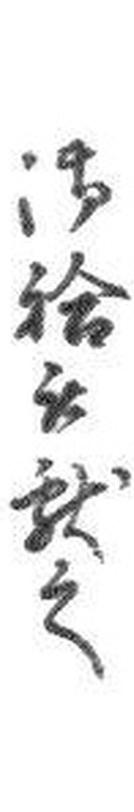御袷被献之
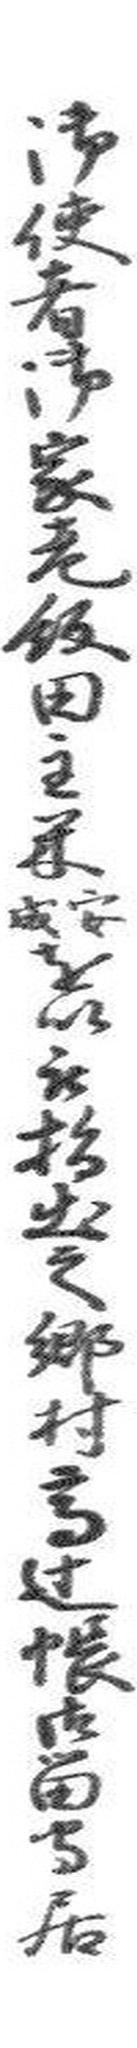御使者御家老飯田主采安成を以被指出之郷村高辻帳御留守居
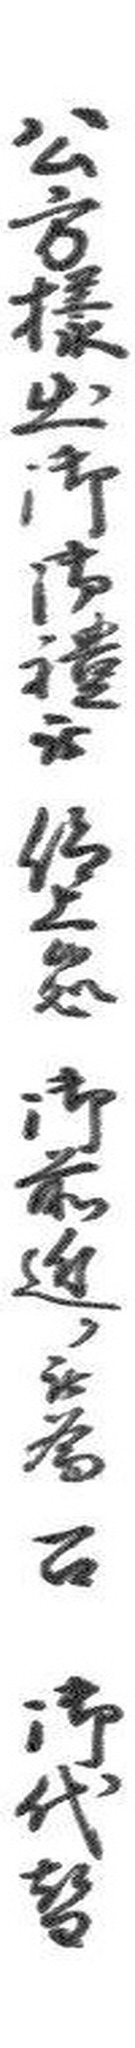公方様出御御礼被仰上候処御前近ク被召御代替
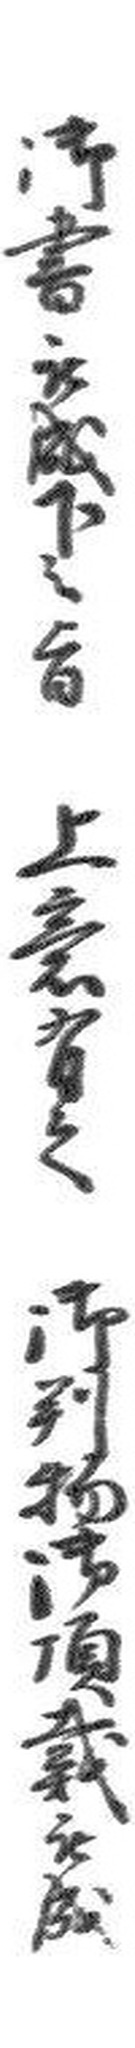御書被成下之旨上意有之御半物御頂戴被成
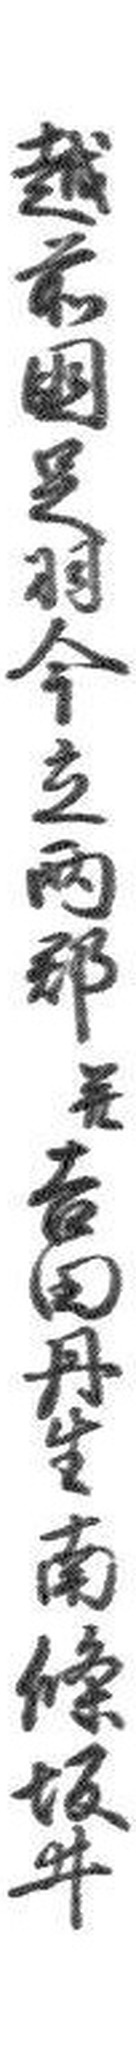越前国足羽今立両郡并吉田丹生南条坂井

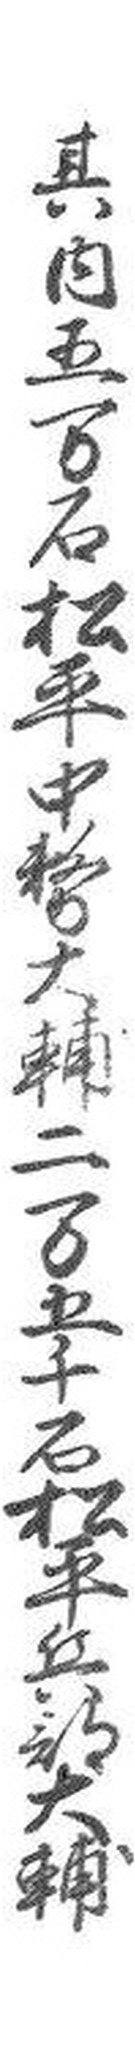其内五万石松平中務大輔二万五千石松平兵部大輔
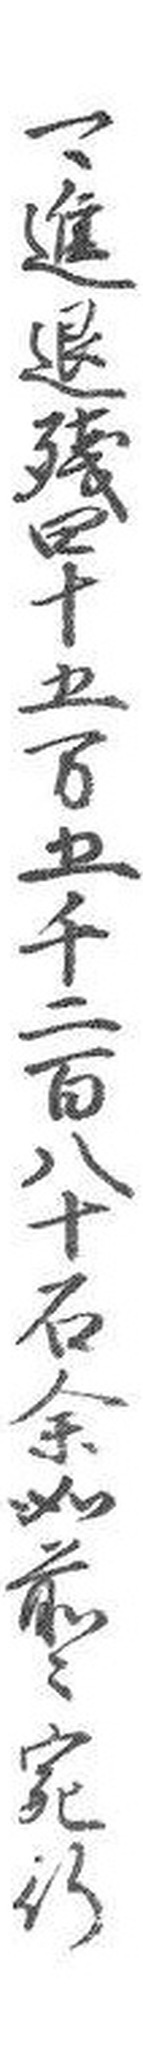可進退残四十五万五千二百八十石余如前々宛行
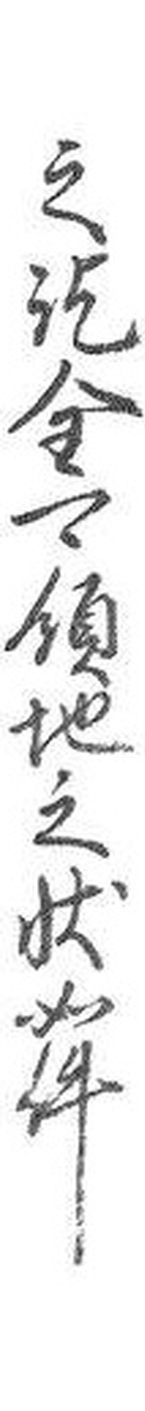之訖全可領地之状如件
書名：家譜 七 光通公 従寛文四年到同九年
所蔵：福井県文書館 Fukui Prefectural Archives
